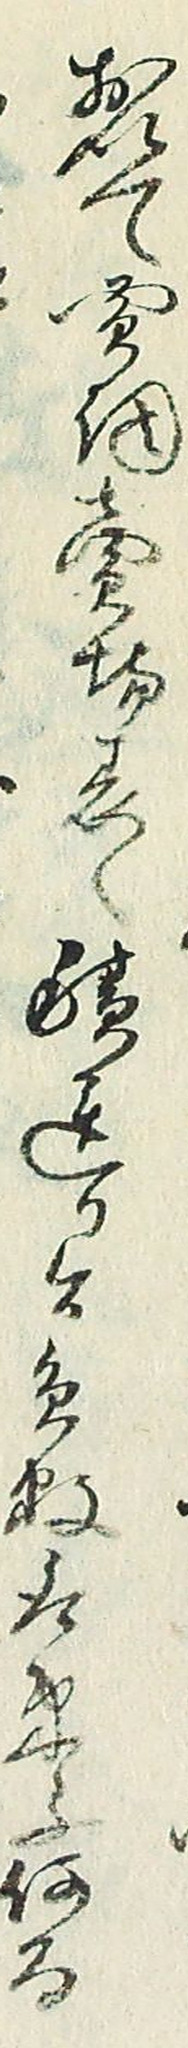おいて買調賣場表へ積送り候員数取束ね何百
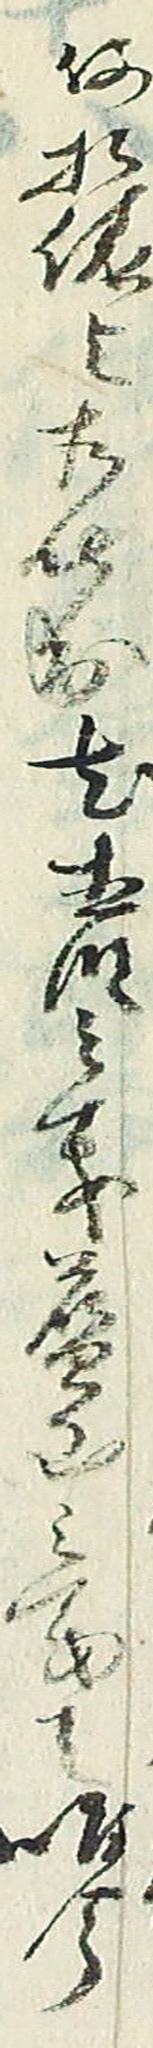何拾俵と相仕出尤直段之義藍玉之義者昨今
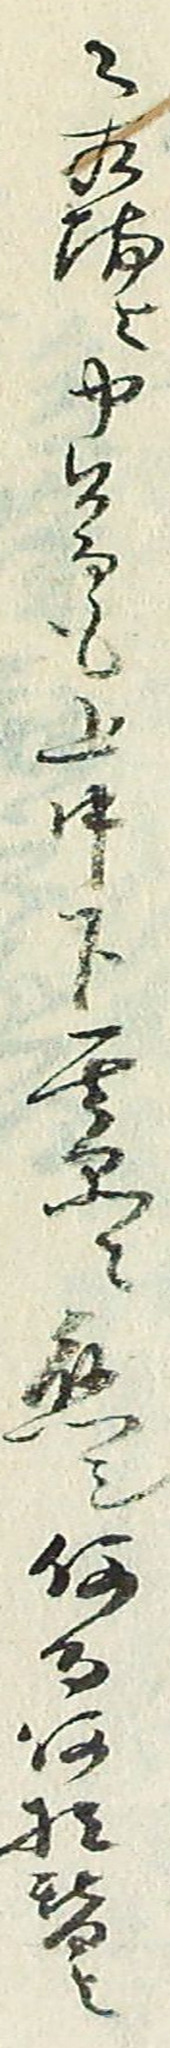之相場と申候而も上中下其品ニ應シ何百何拾替と
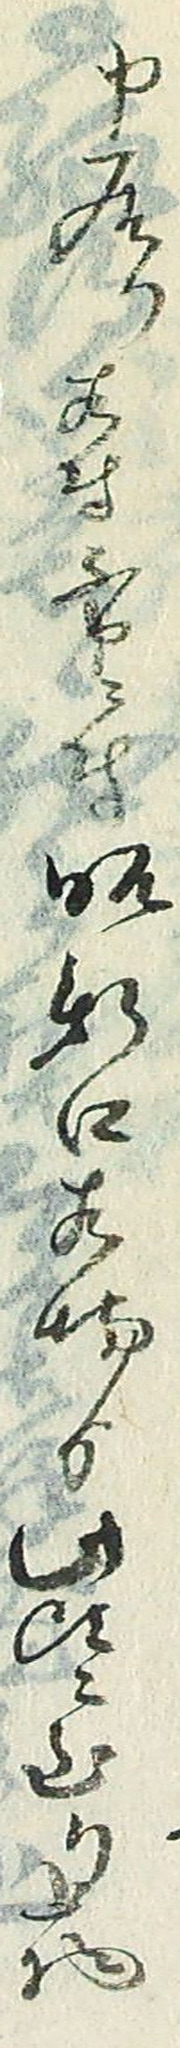申居り相付不申ニ付昨新口相場ゟ此頃ニ至り上物
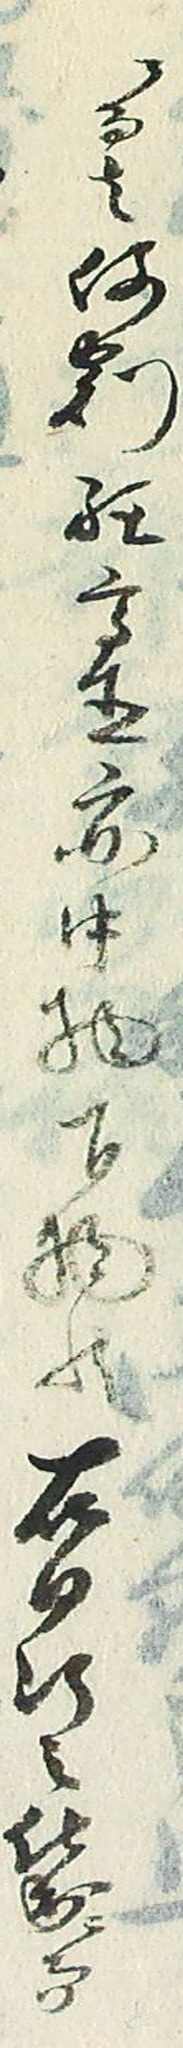ニ而者何割程高直亦中物下物共右同断之仕出ニ而
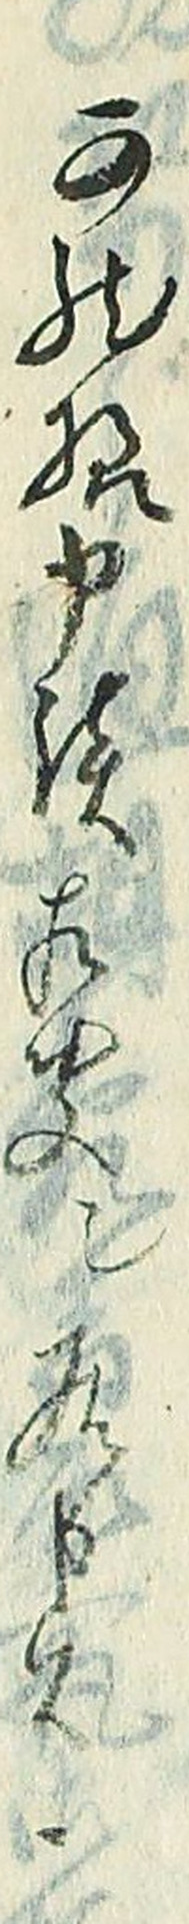可然様申談相決シ居申候
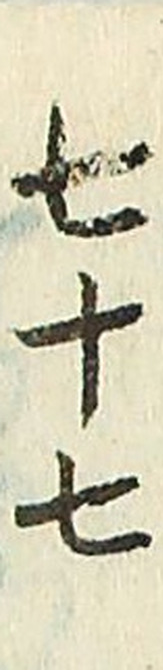七十七
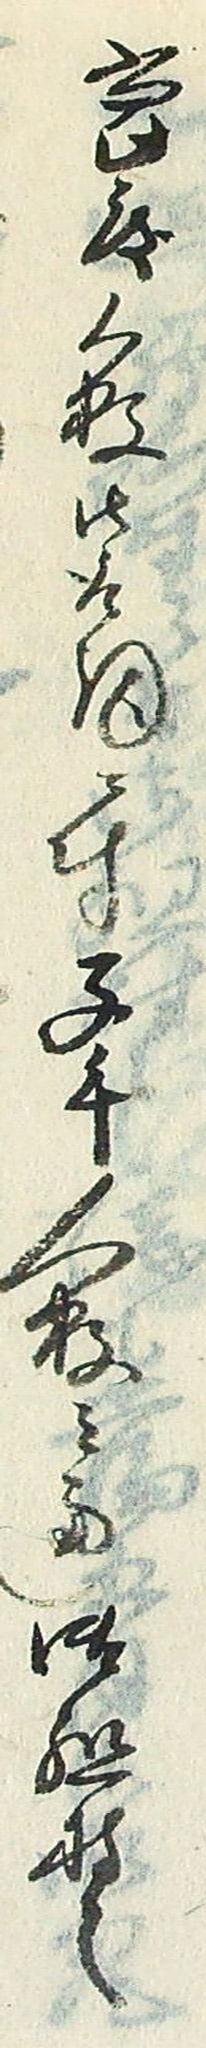尚此度人数御取調ニ付子午人数之通御組村之
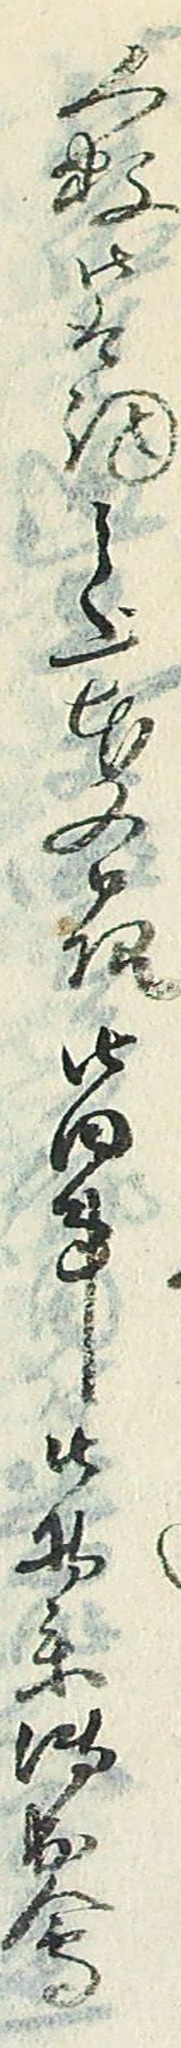人数御取調之上本文日限御同事御持参御出會
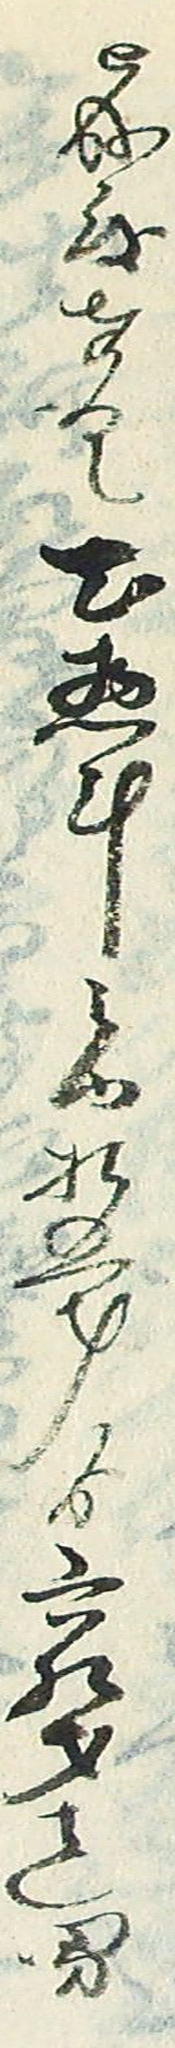被成度奉存候尤惣計之内拾五才ゟ六拾才迄男
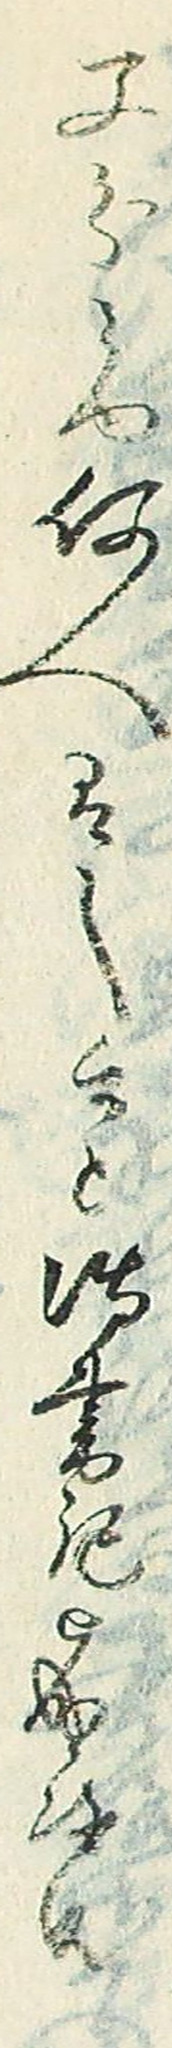子分之内何人有之候と御書記被成度候
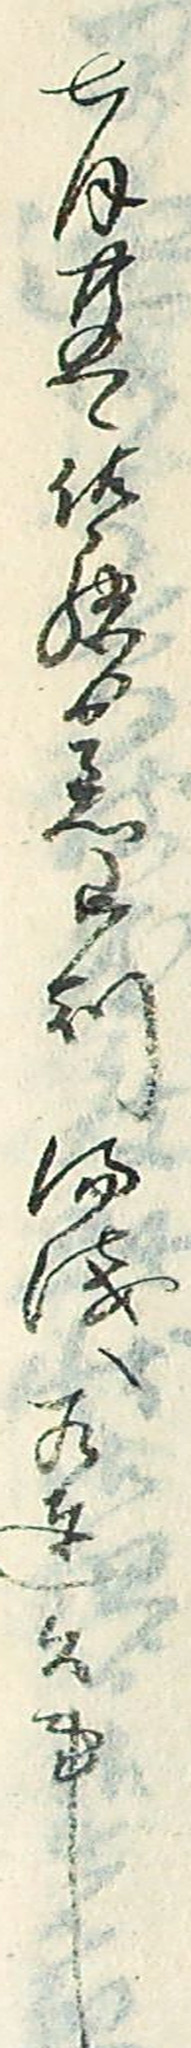七月廿五日佐藤ゟ着即刻湯浅へ相達候事

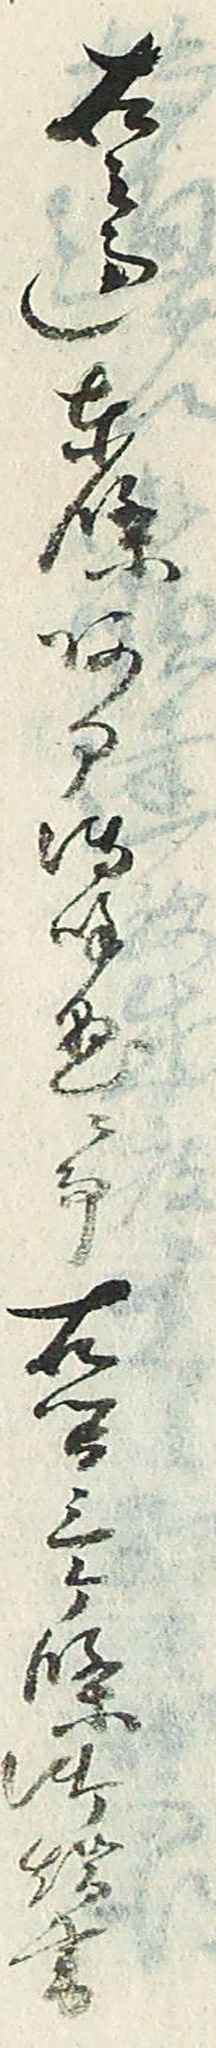右之通東條阿部御呼懸ニ而右写三ケ條御端書
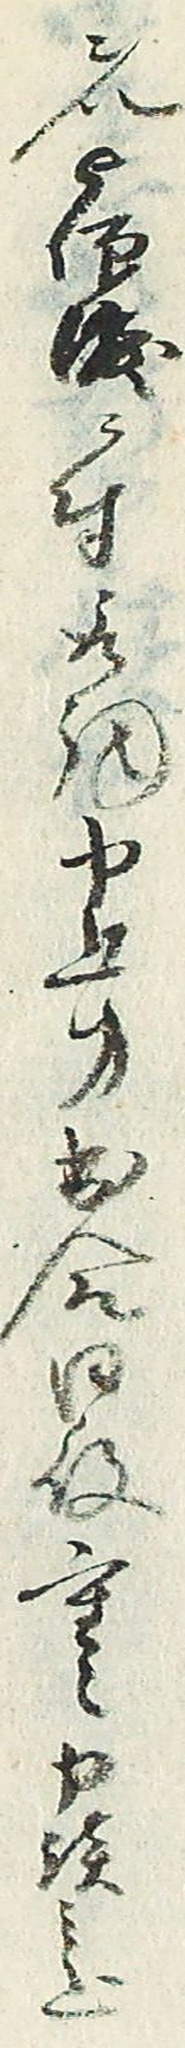ヲ以被仰渡ニ付取調申上方出合同役重々申談之上
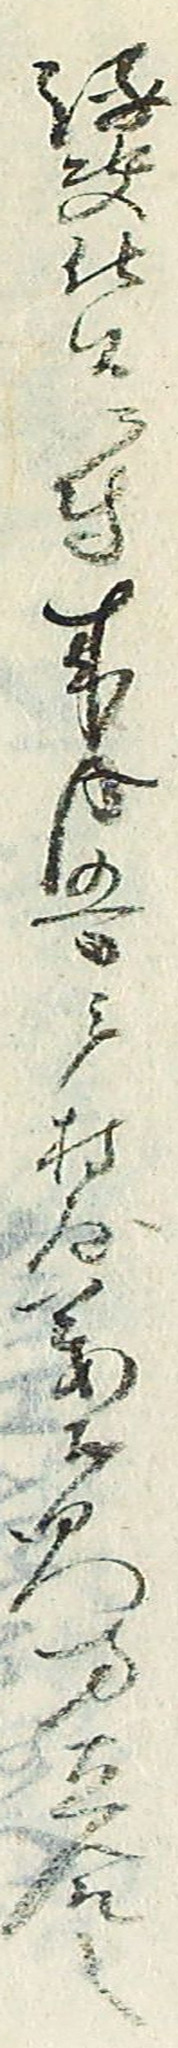評決仕候ニ付来月五日戸村屋義右衛門方直合之
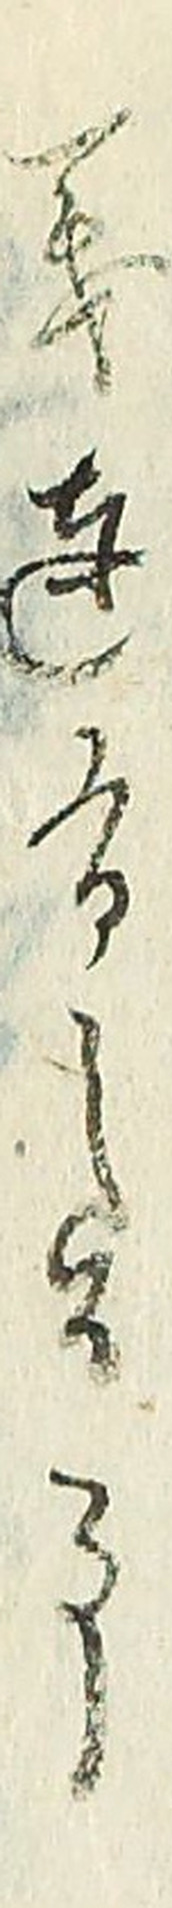義達有之候事
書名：諸御趣意書并御下知向之写
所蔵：鳴門教育大学 Naruto University of Education
